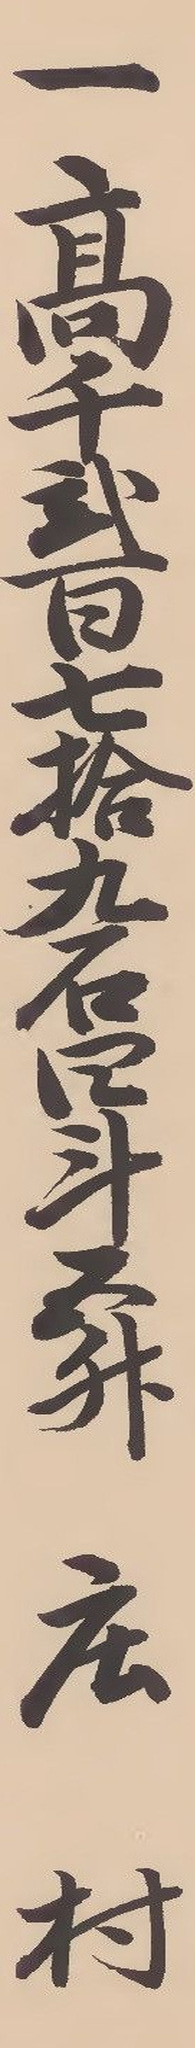一高千弐百七拾九石四斗五升庄村
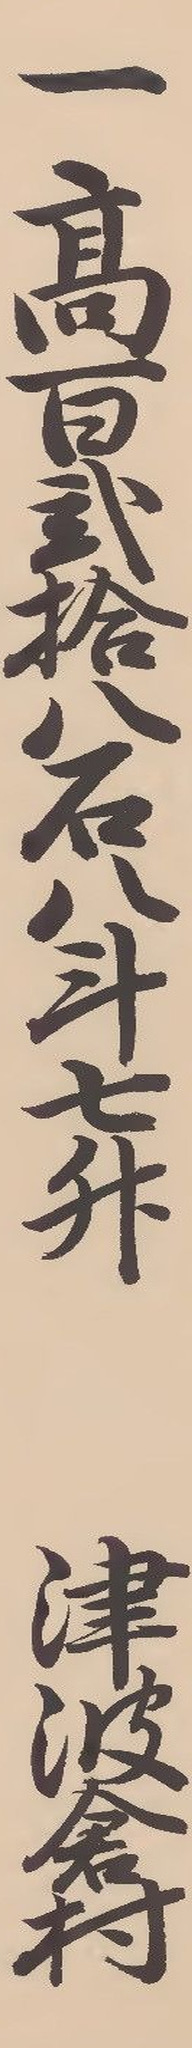一高百弐拾八石八斗七升津波倉村
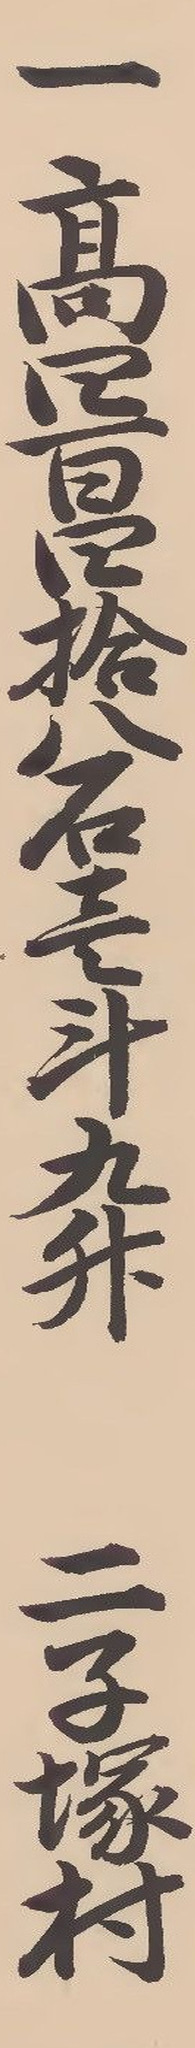一高四百四拾八石壱斗九升二子塚村
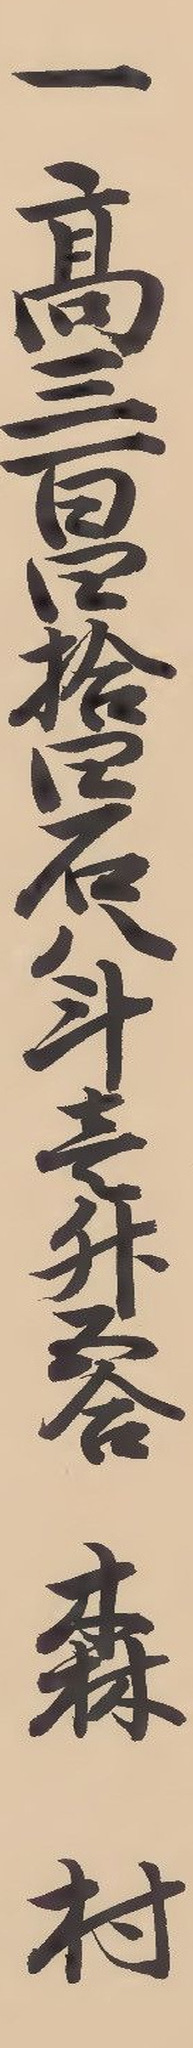一高三百四拾四石八斗壱升五合森村
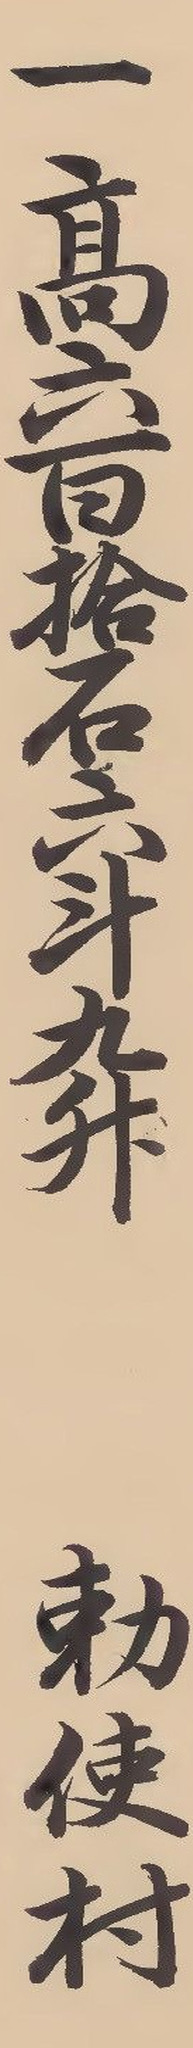一高六百拾石六斗九升勅使村
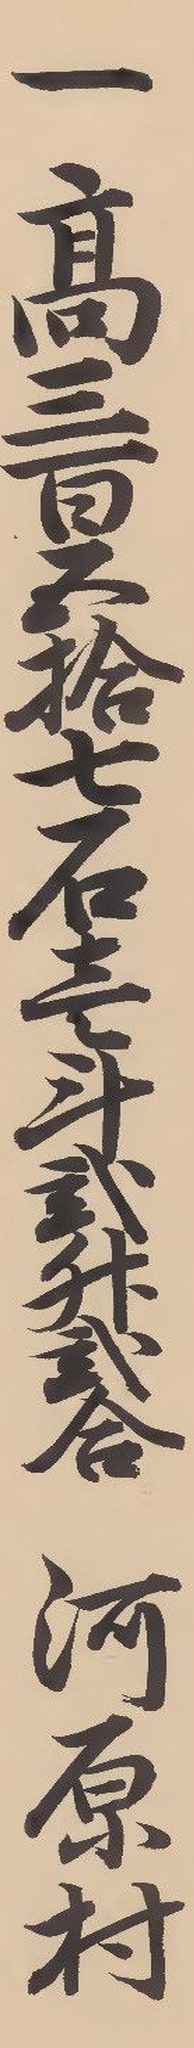一高三百五拾七石壱斗弐升弐合河原村
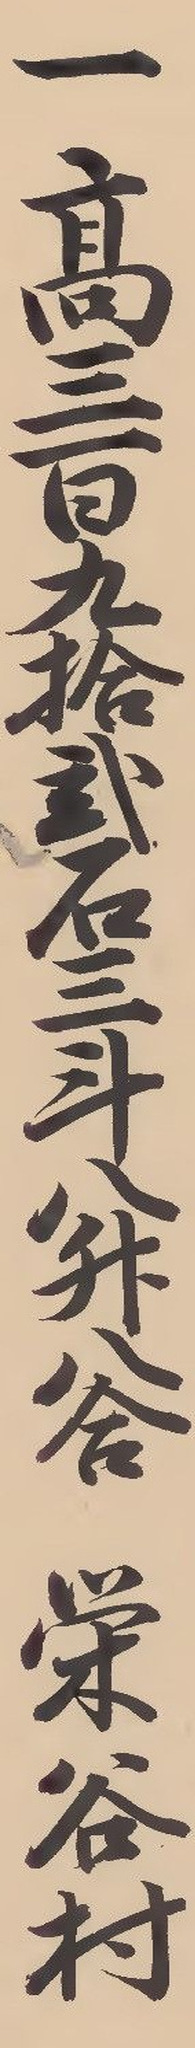一高三百九拾弐石三斗八升八合栄谷村

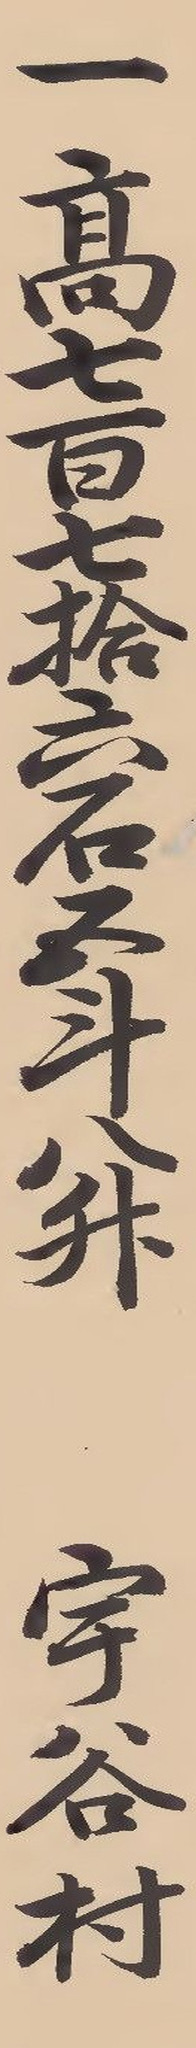一高七百七拾六石五斗八升宇谷村
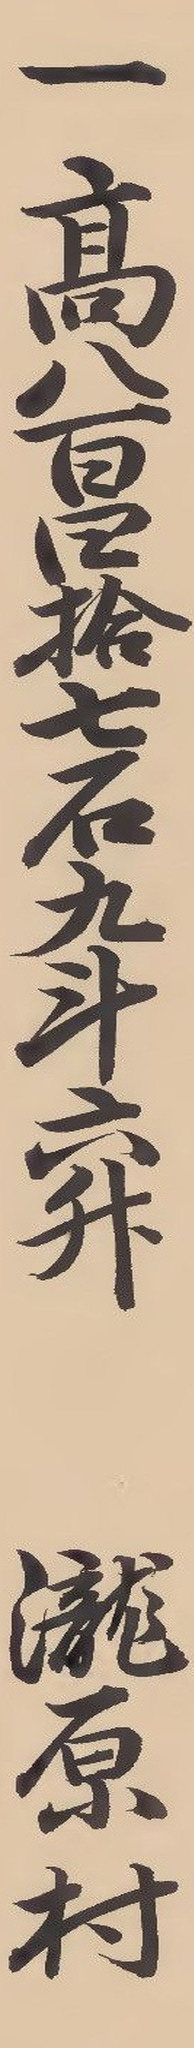一高八百四拾七石九斗六升滝原村
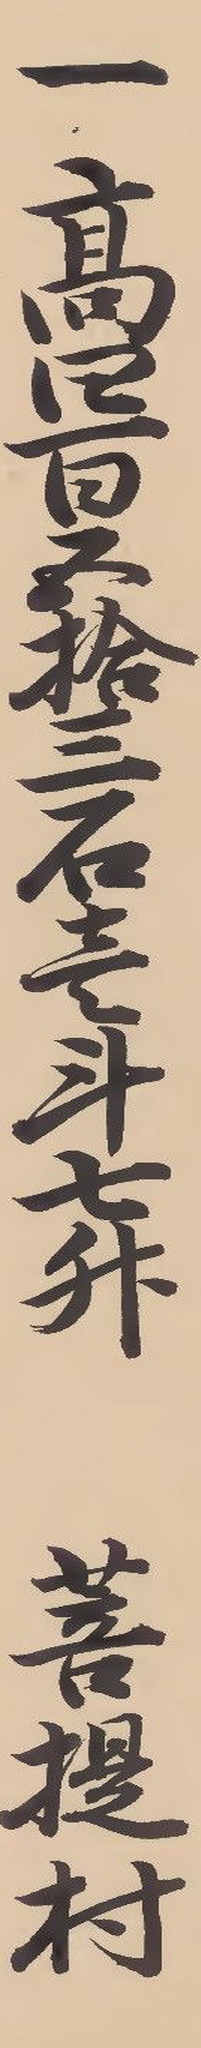一高四百五拾三石壱斗七升菩提村
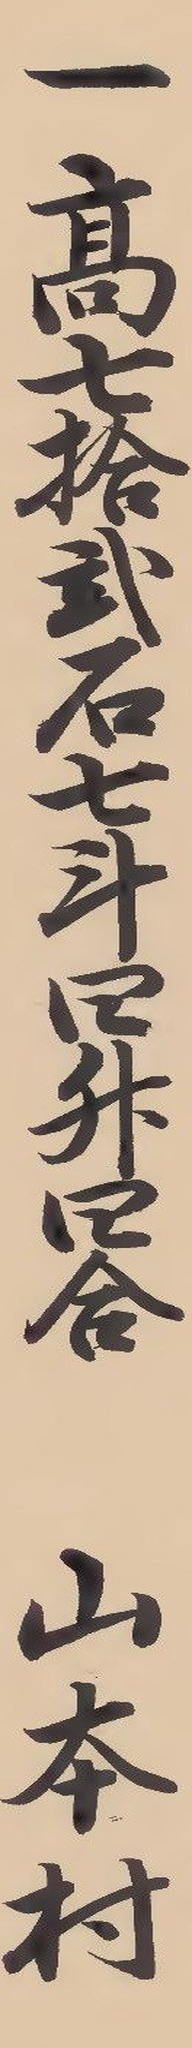一高七拾弐石七斗四升四合山本村
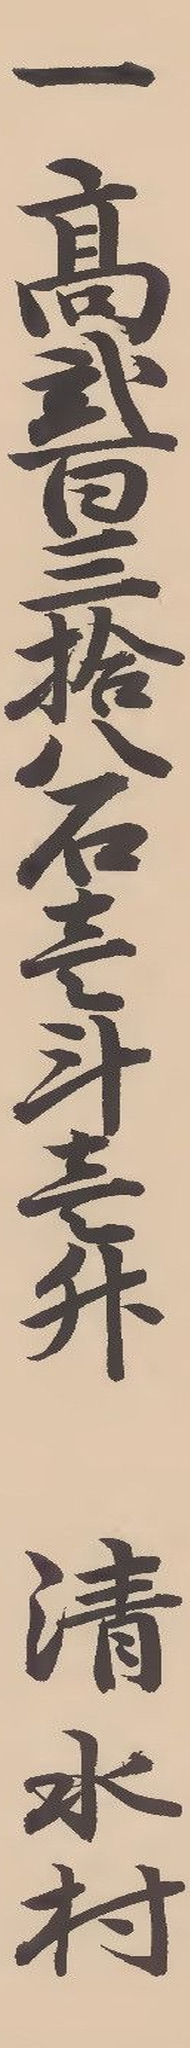一高弐百三拾八石壱斗壱升清水村
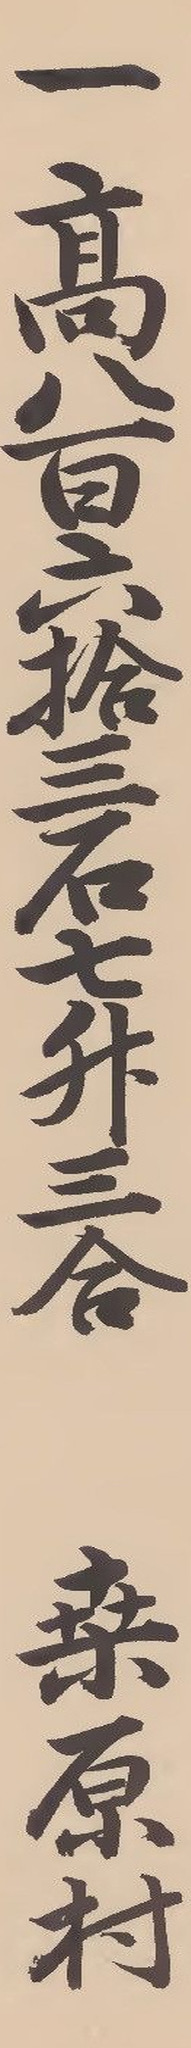一高八百六拾三石七升三合桑原村
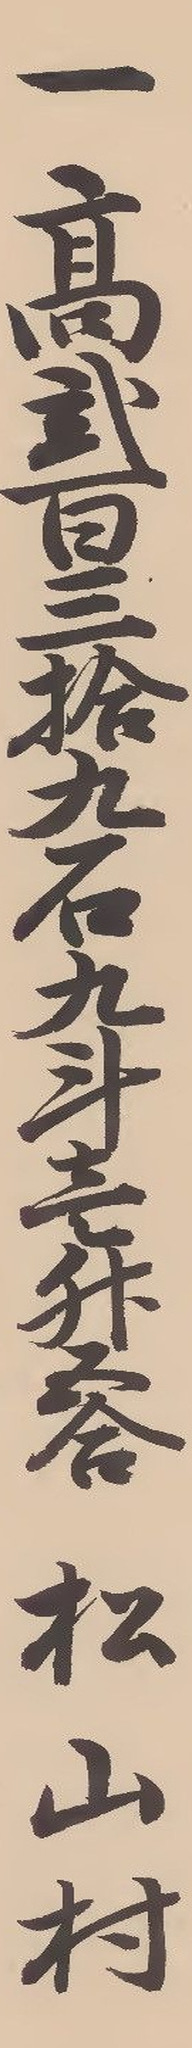一高弐百三拾九石九斗壱升五合松山村
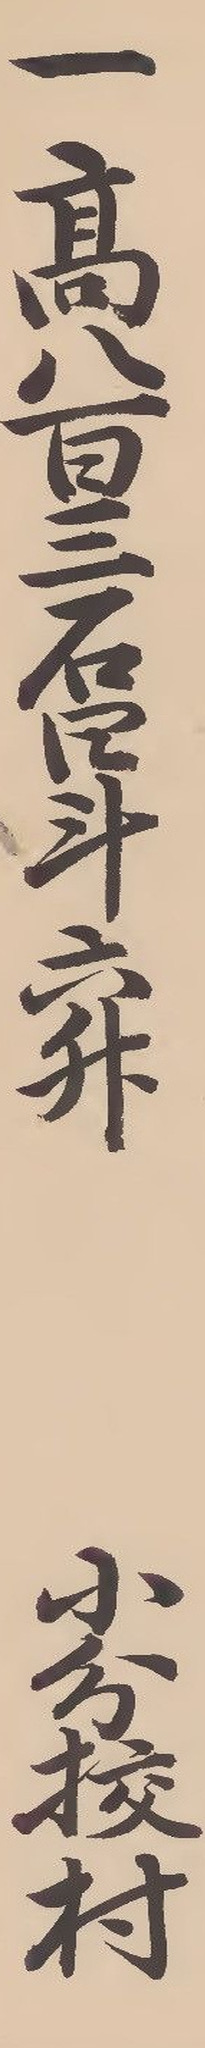一高八百三石四斗六升小分校村

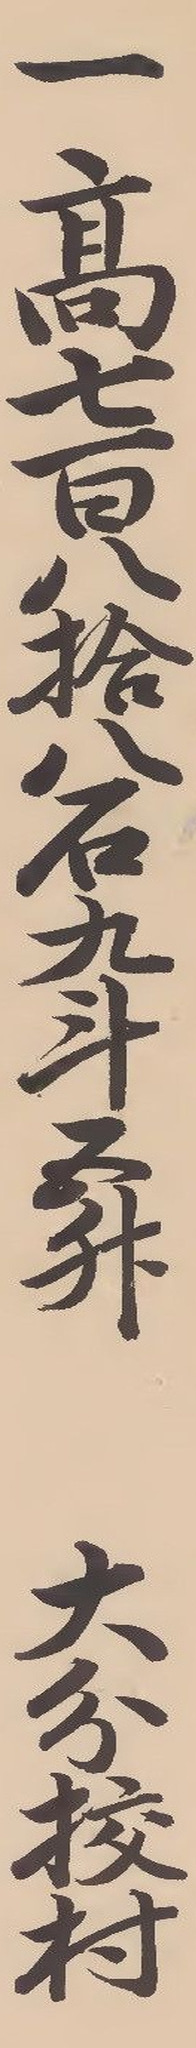一高七百八拾八石九斗五升大分校村
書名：加賀国郷帳
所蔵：国立公文書館 National Archives of Japan
